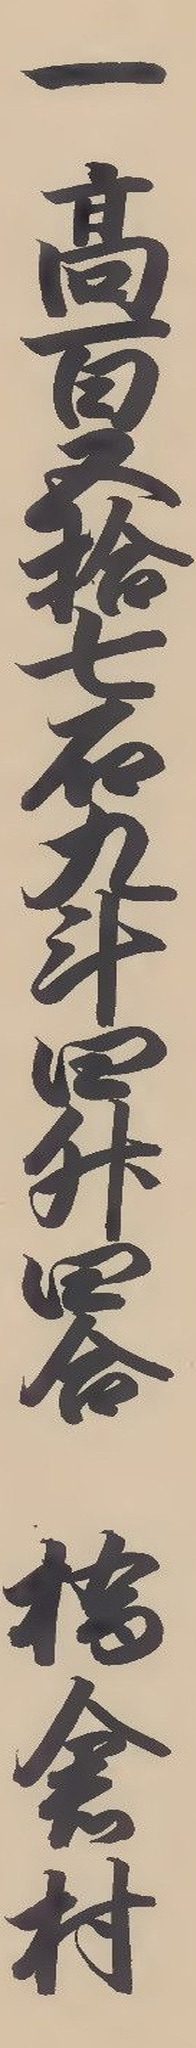一高百五拾七石九斗四升四合橋倉村
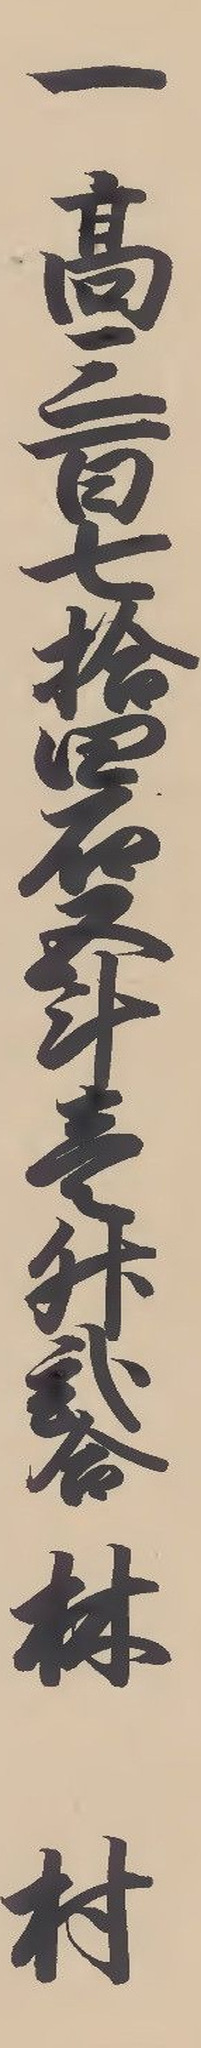一高三百七拾四石五斗壱升弐合林村
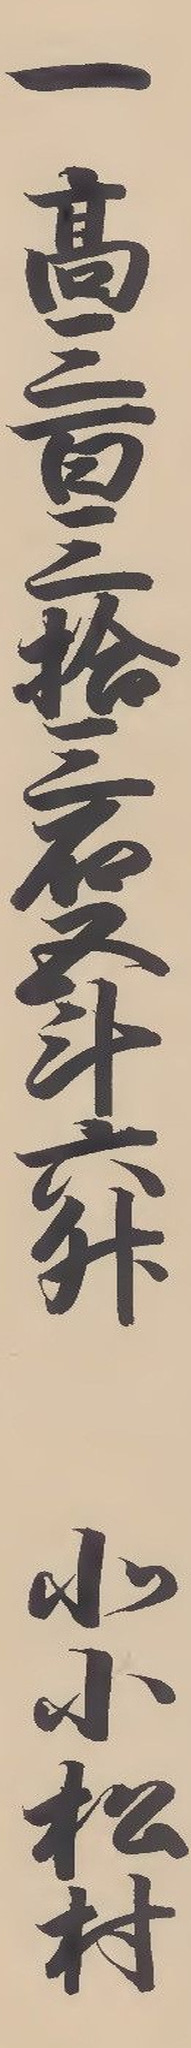一高三百三拾三石五斗六升北小松村
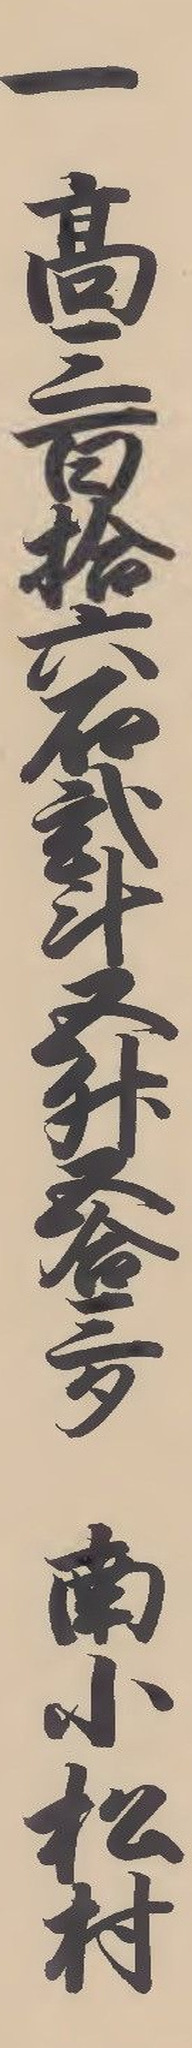一高三百拾六石弐斗五升五合三勺南小松村
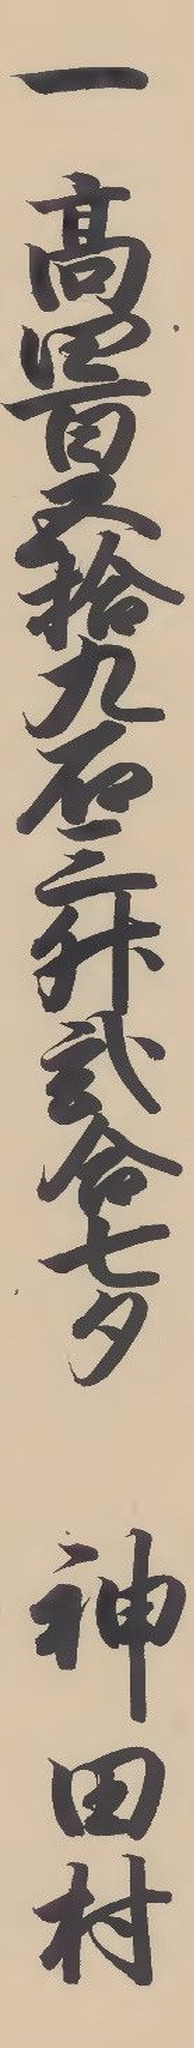一高四百五拾九石三升弐合七勺神田村
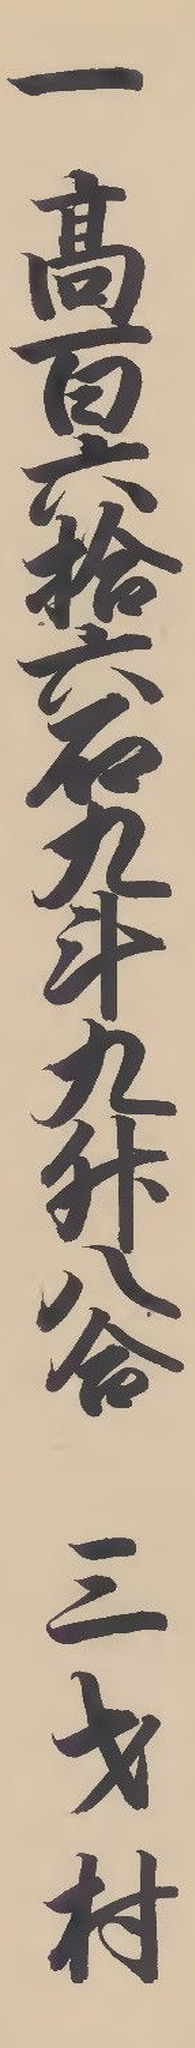一高百六拾六石九斗九升八合三才村

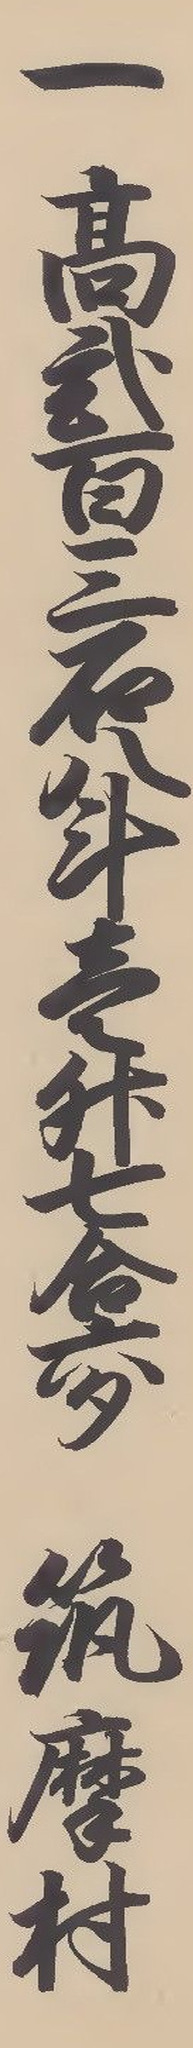一高弐百三石八斗壱升七合六勺筑摩村
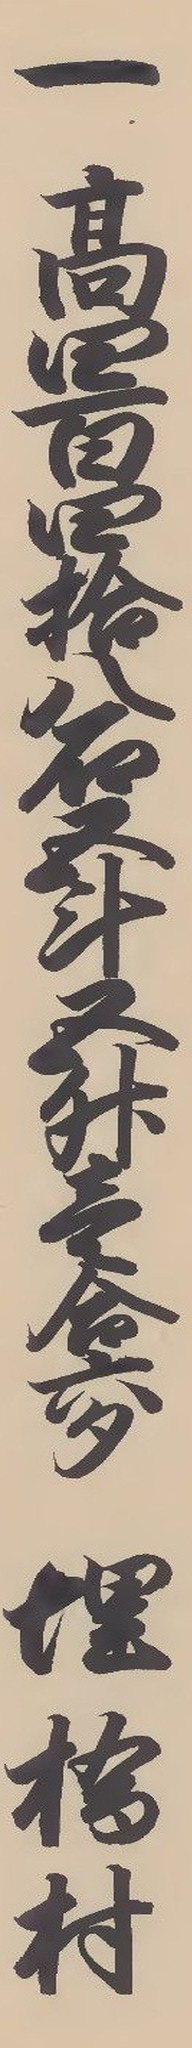一高四百四拾八石五斗五升壱合六勺埋橋村
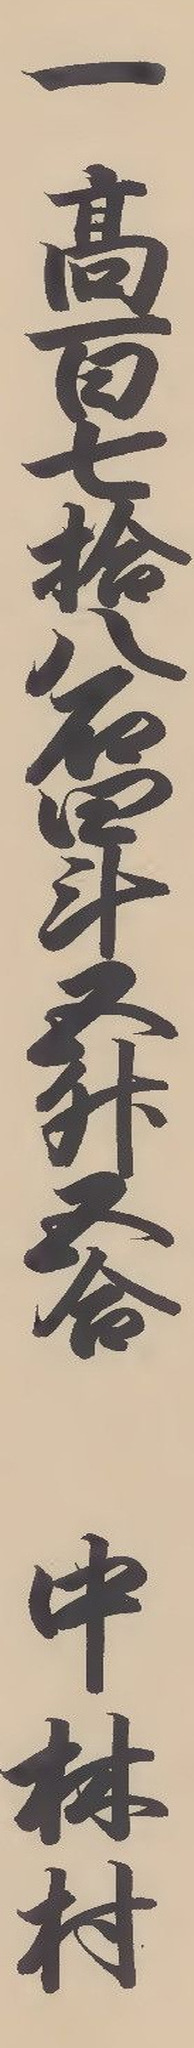一高百七拾八石四斗五升五合中林村
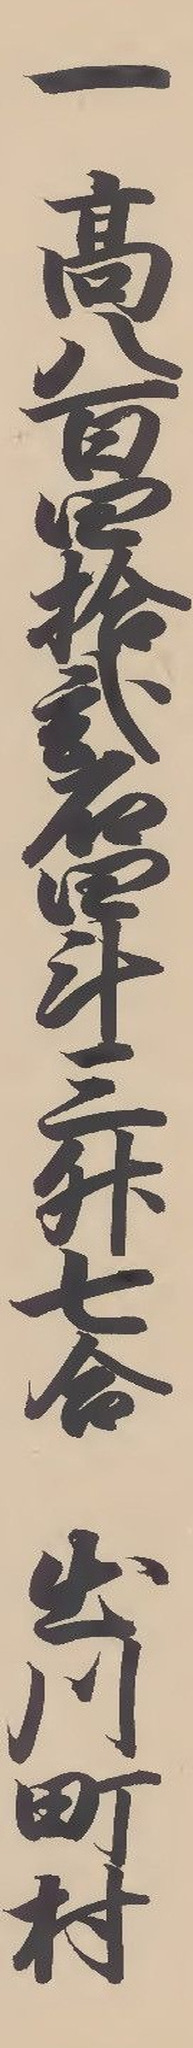一高八百四拾弐石四斗三升七合出川町村
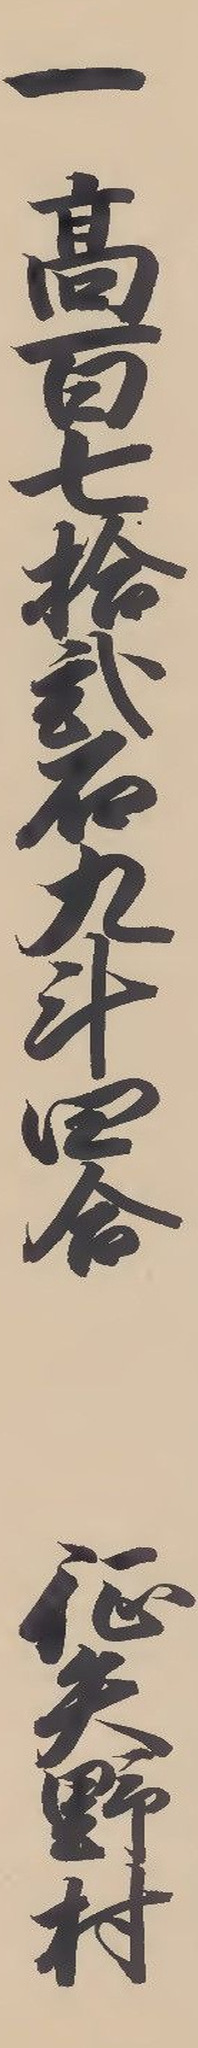一高百七拾弐石九斗四合征矢野村
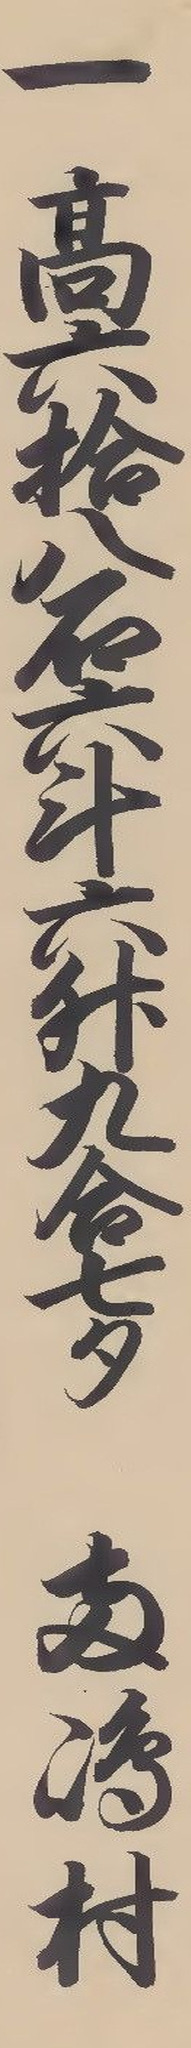一高六拾八石六斗六升九合七勺両島村
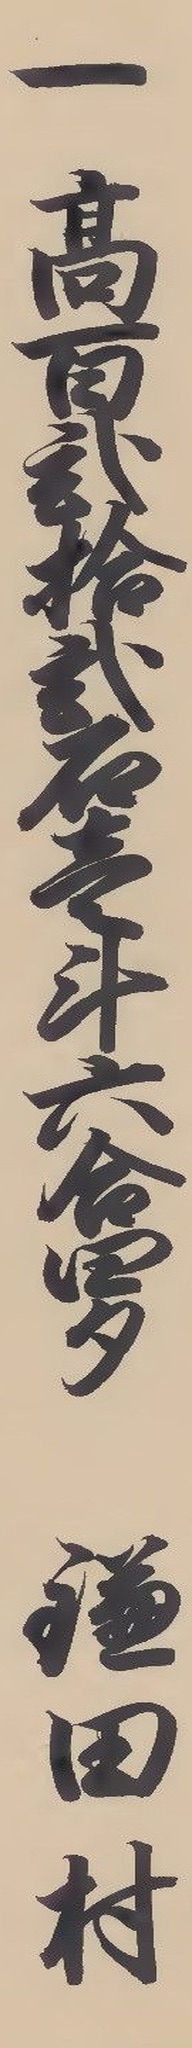一高百弐拾弐石壱斗六合四勺鎌田村
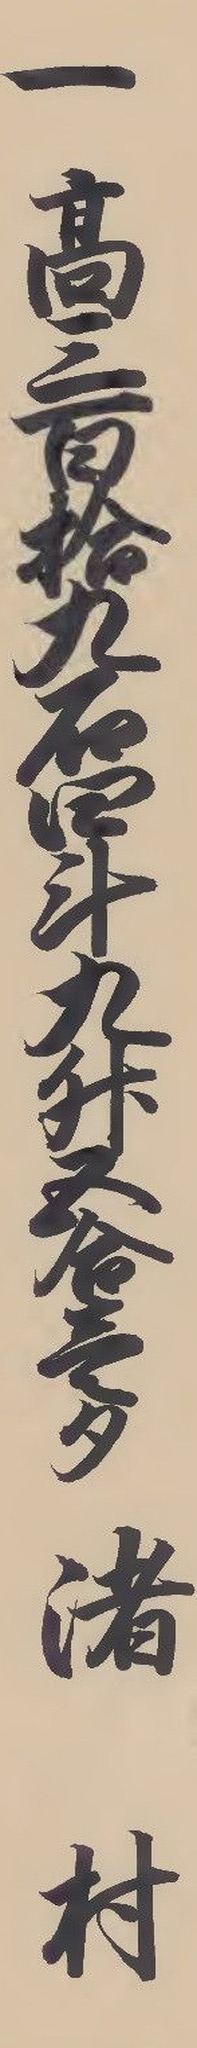一高三百拾九石四斗九升五合壱勺渚村

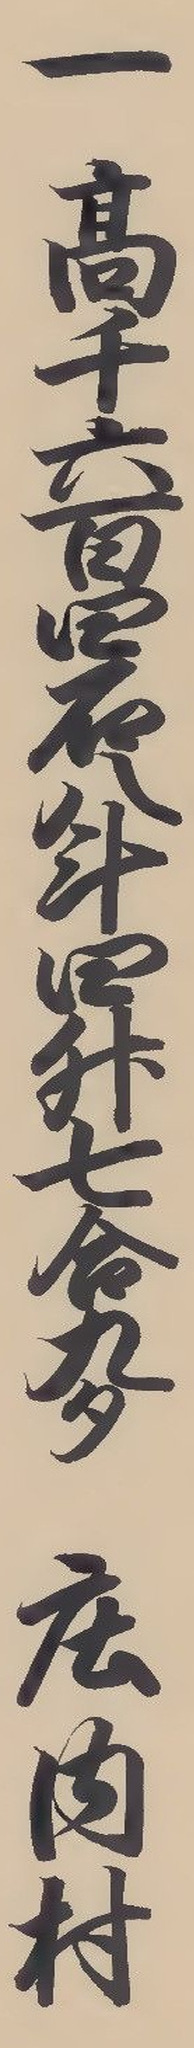一高千六百四石八斗四升七合九勺庄内村
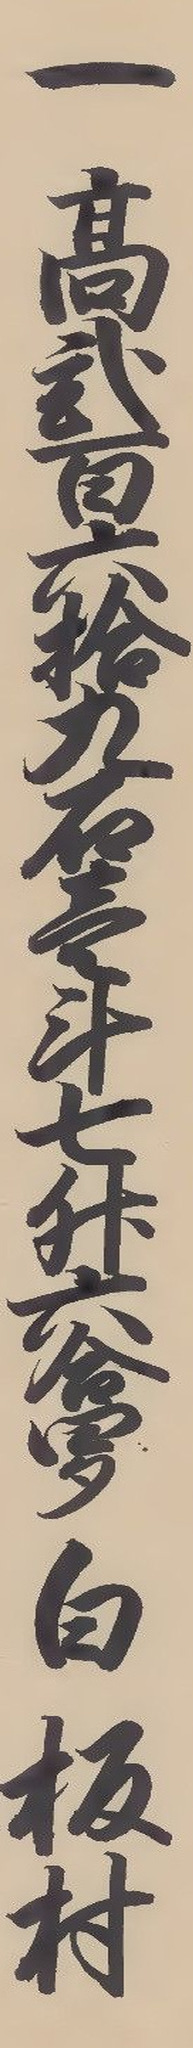一高弐百六拾九石壱斗七升六合四勺白板村
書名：信濃国郷帳
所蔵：国立公文書館 National Archives of Japan
